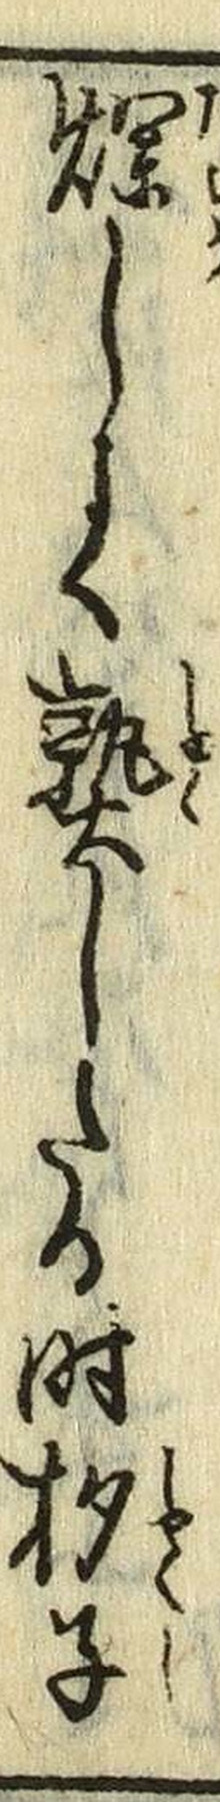爛して熟したる時杓子
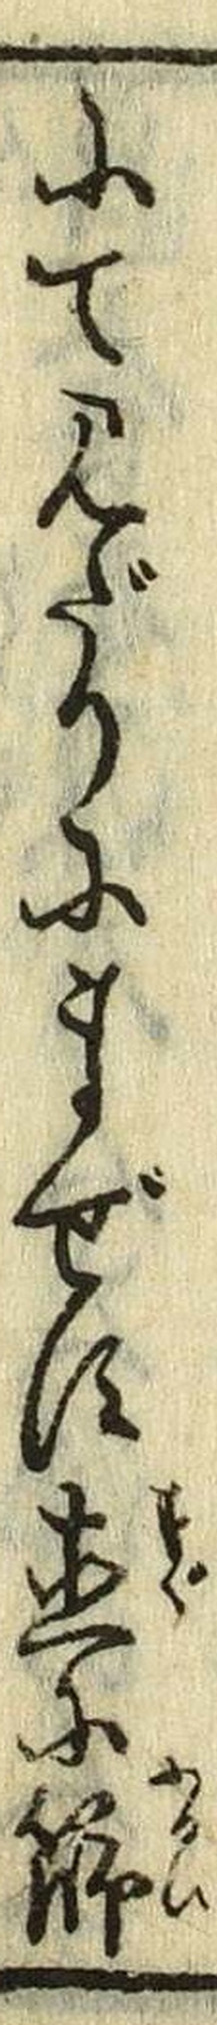にてみだりにまぜす直に篩
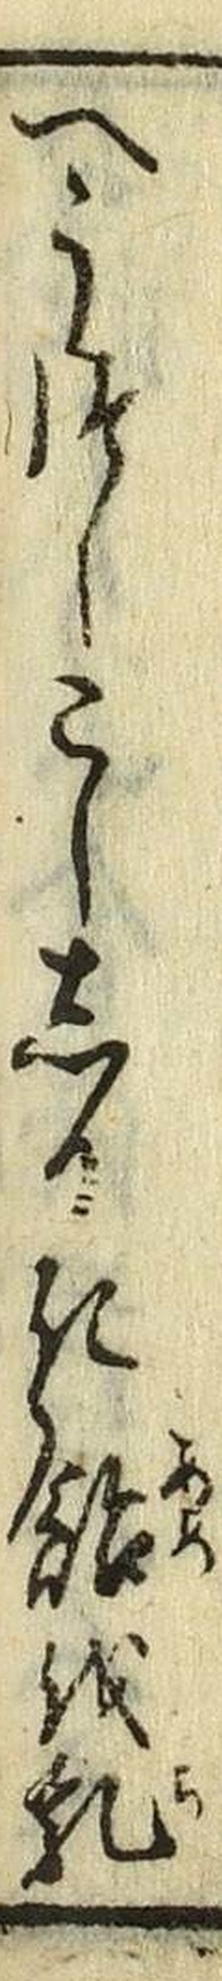へうつしこししかき飴を乳
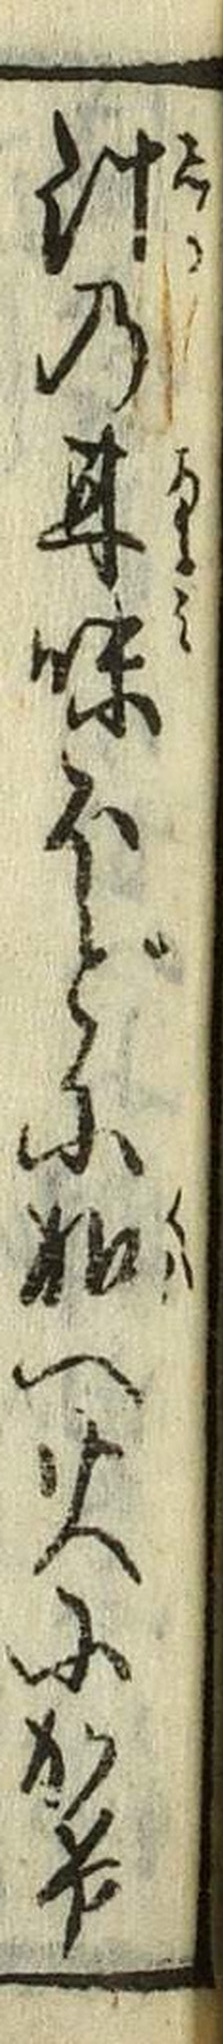汁の甘味ほどに加へ火にかけ
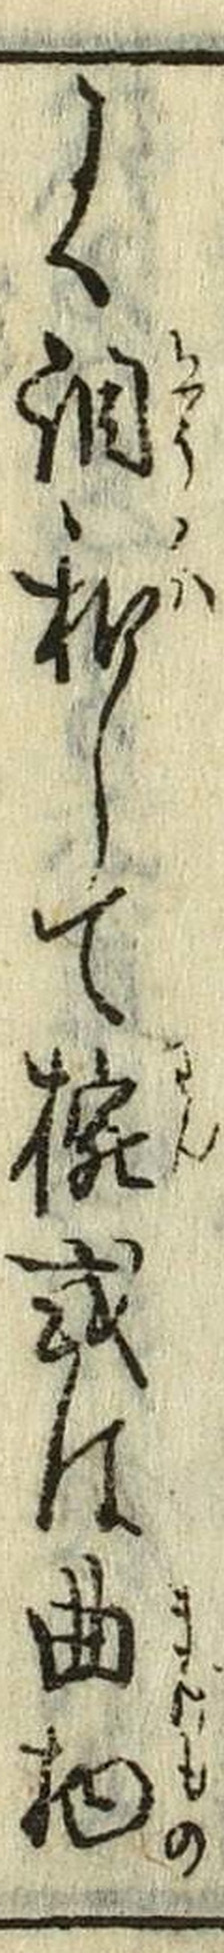よく調和して椀或は曲物
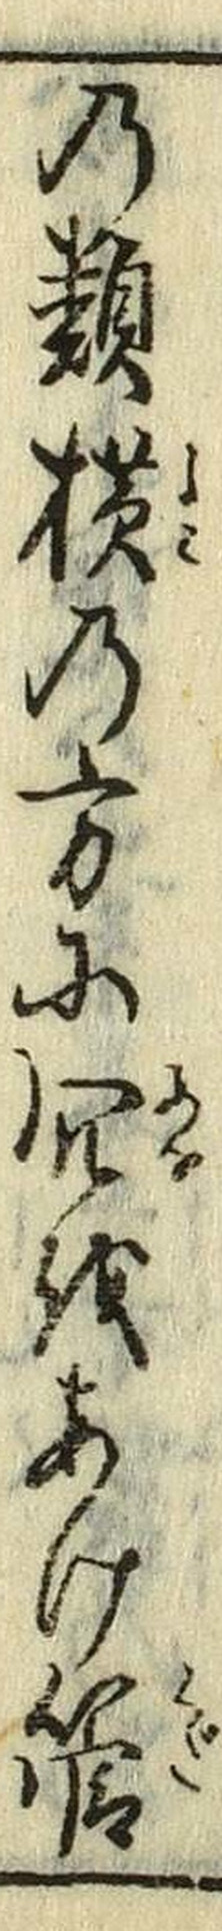の類横の方に穴をあけ管
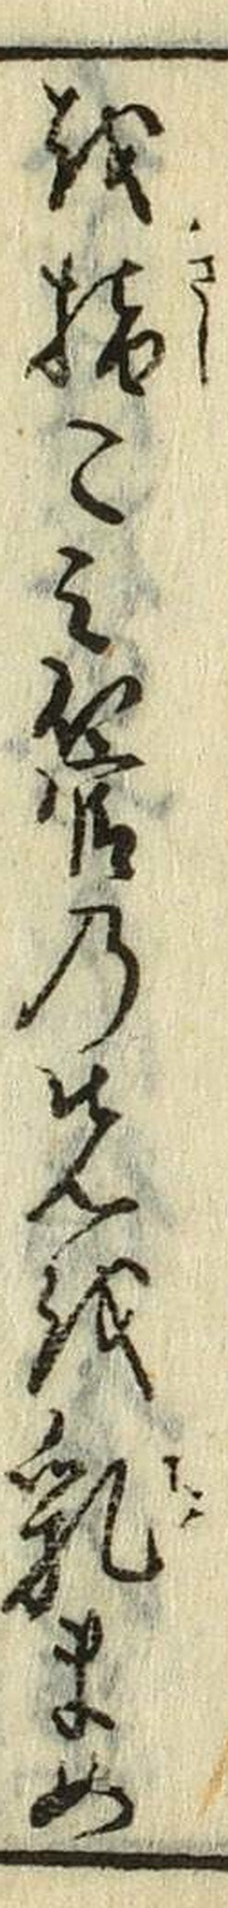を指こみ管の先を乳まめ
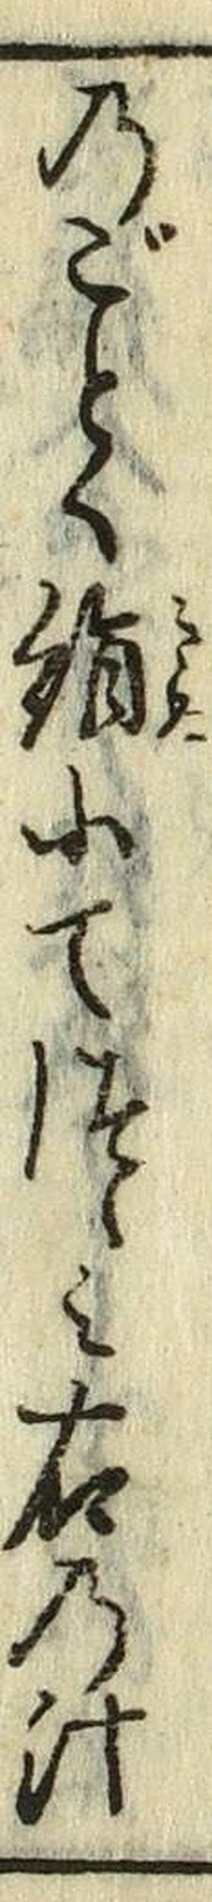のごとく絹にてつゝみ右の汁
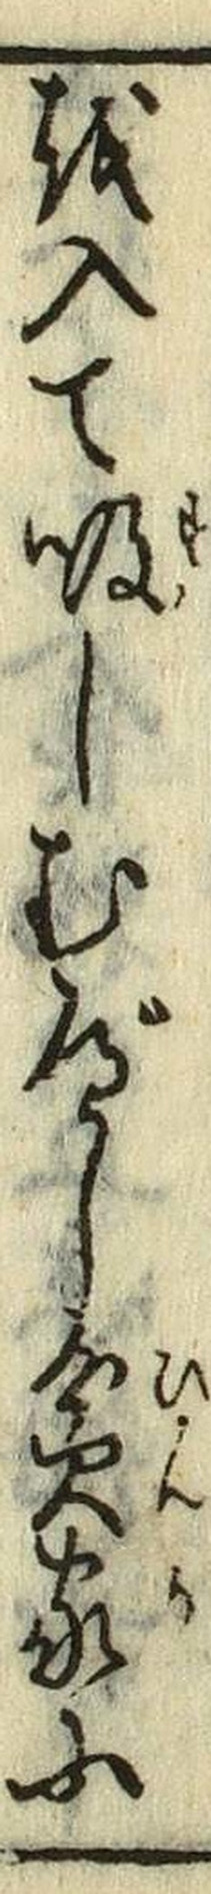を入て吸しむべし貧家に
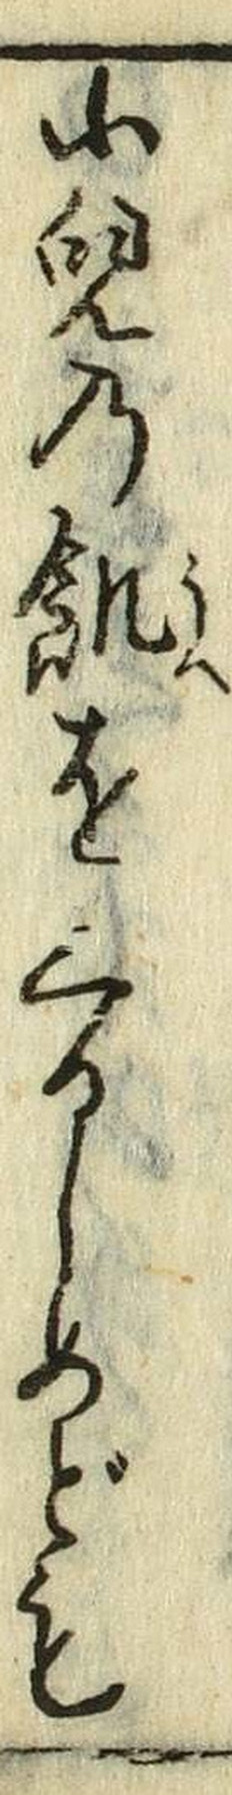小児の飢をくるしめども
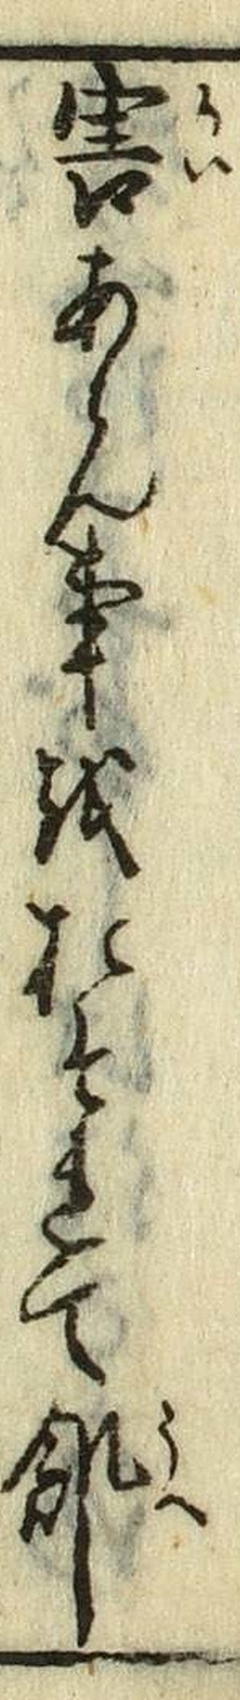害あらん事をおそれて飢し
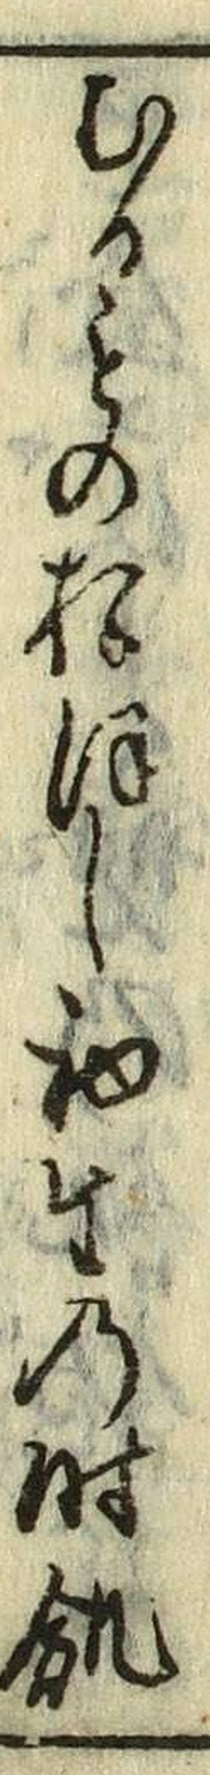むるものおほし初生の時飢
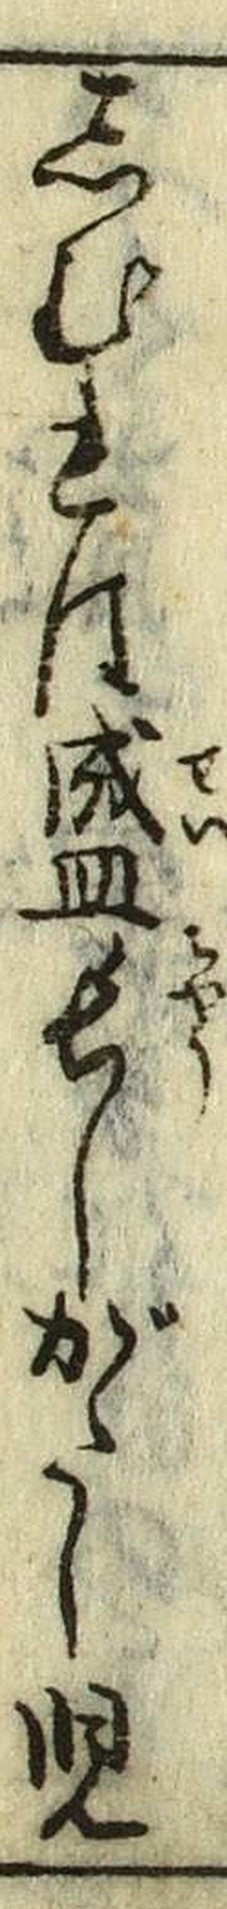しむれは盛長しがたし児
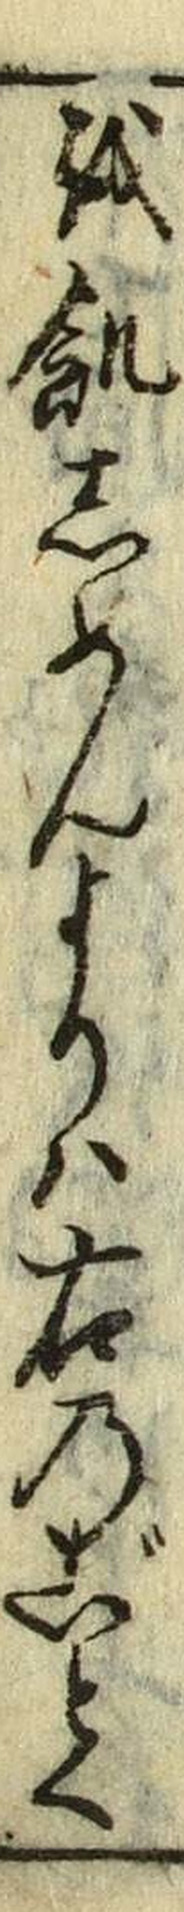を飢しめんよりは右のごとく

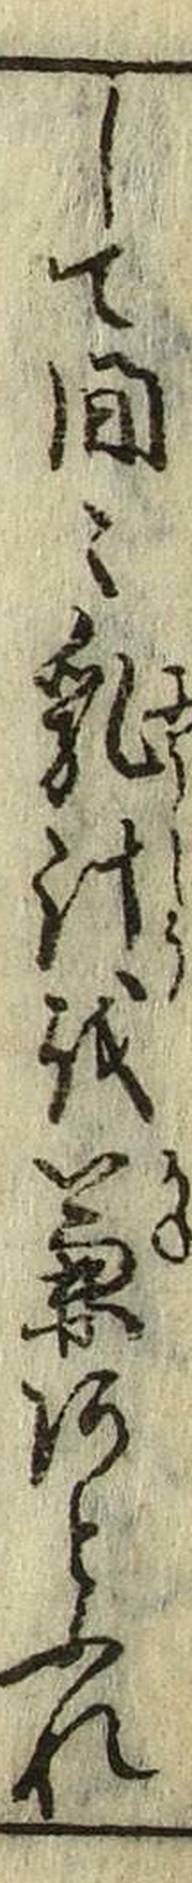して間々乳汁を兼あとふれ
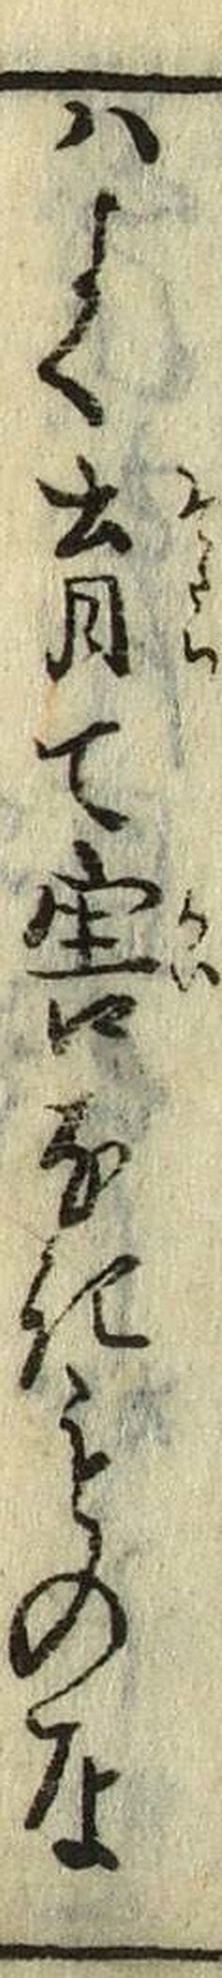はよく育て害なきものな
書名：居家養生記
